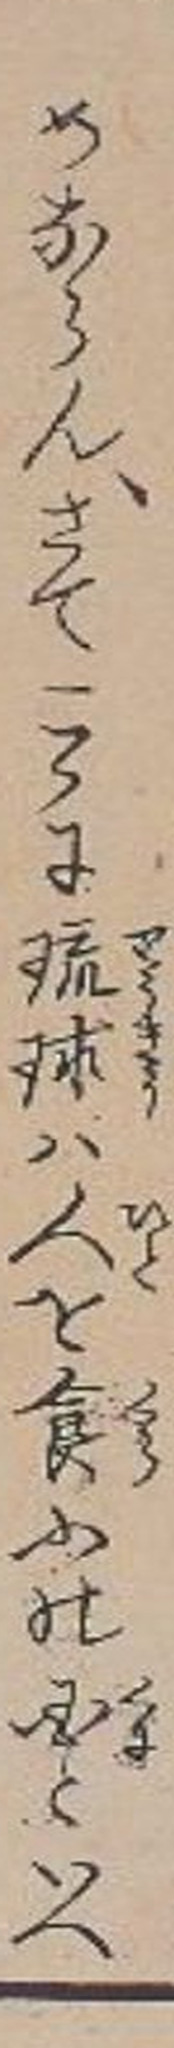めならん、さてこゝに琉球は人を食ふの国といへ
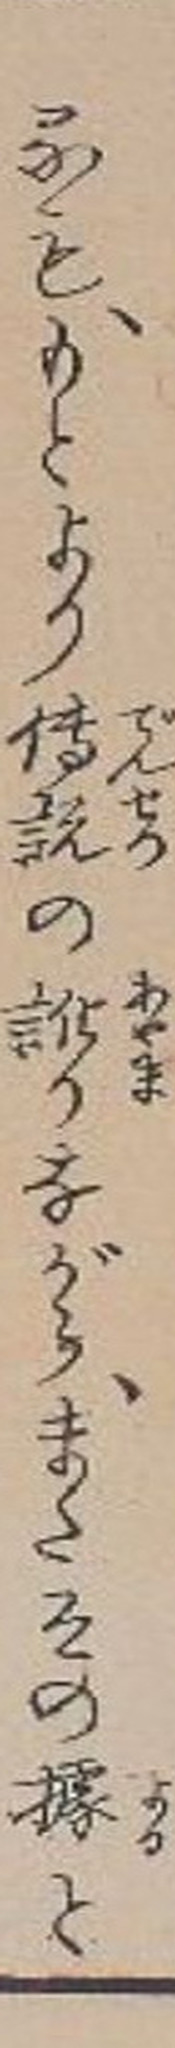るも、もとより伝説の訛りながら、またその拠と
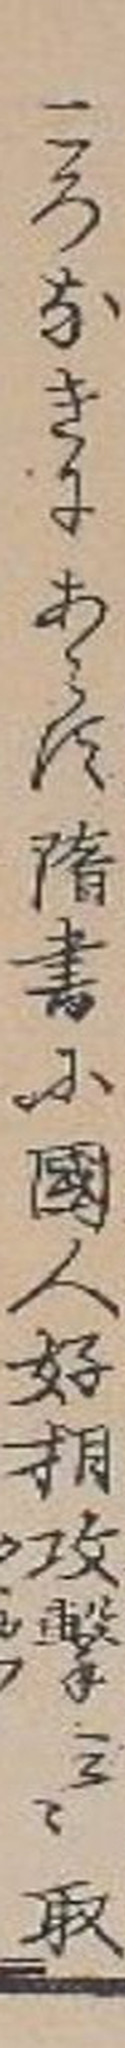ころなきにあらず、隋書に国人好相攻撃云々、取
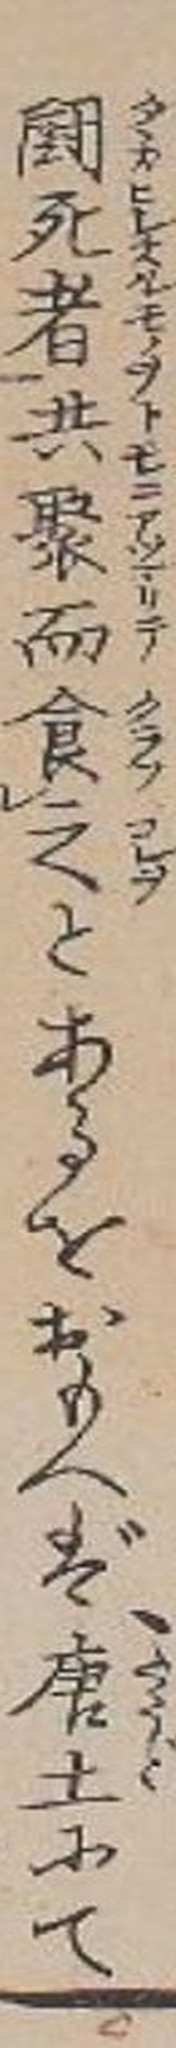闘死者共聚而食之とあるをおもへば、唐土にて
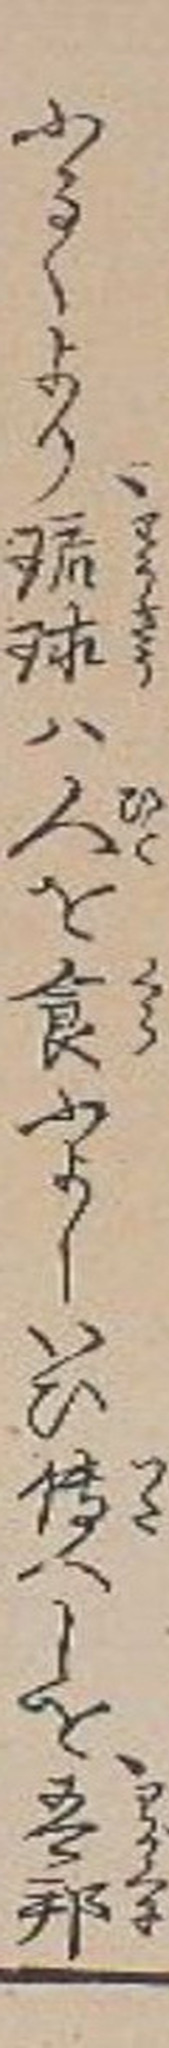ふるくより、琉球は人を食ふよしいひ伝へしを、吾邦
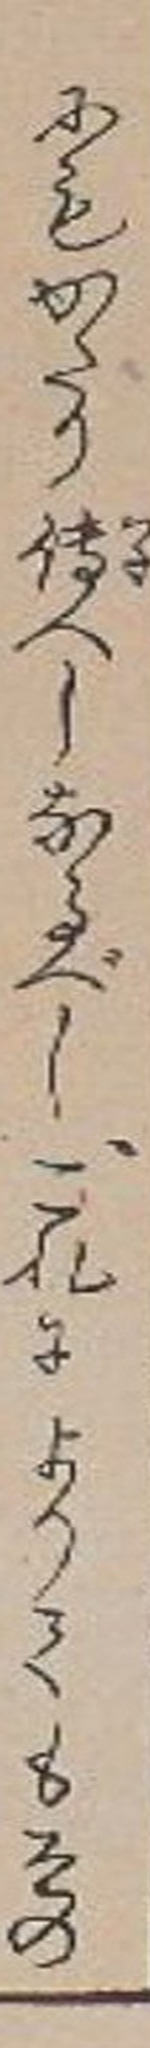にもかたり伝へしなるべし、これによりてもその
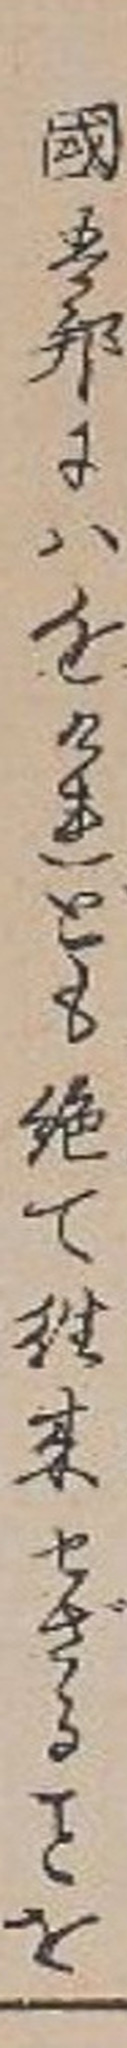国吾邦には近けれども、絶て往来せざることを
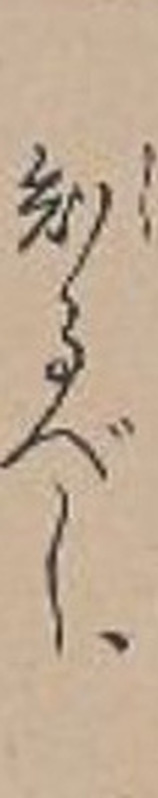知るべし、
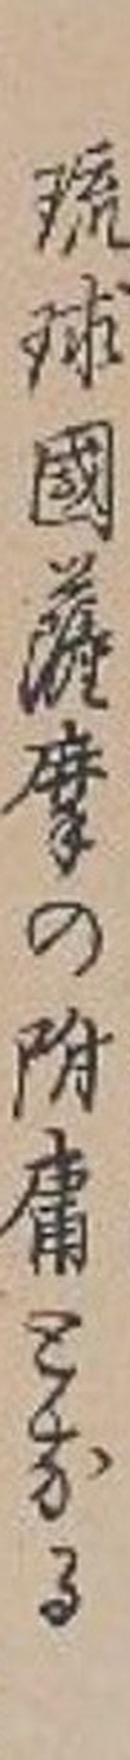琉球国薩摩の附庸となる
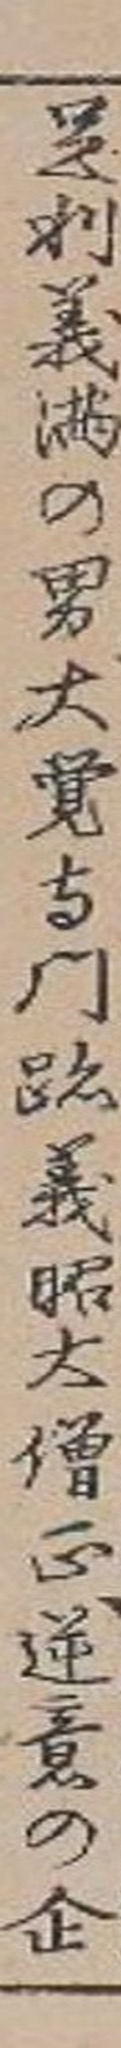足利義満の男、大覚寺門跡義昭大僧正、逆意の企
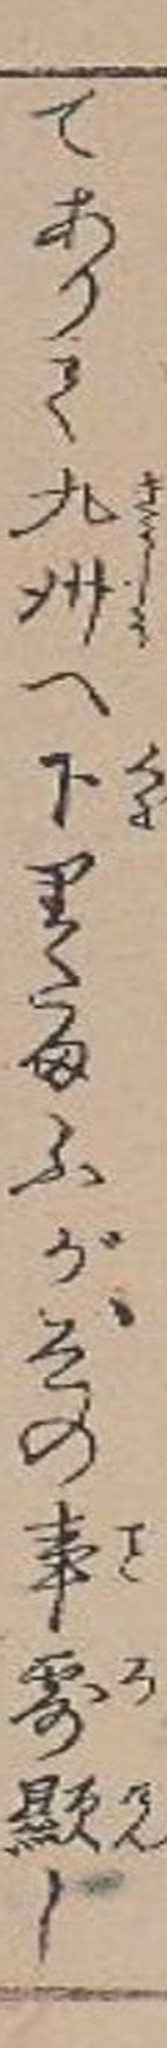てありて九州へ下りたまふが、その事露顕し
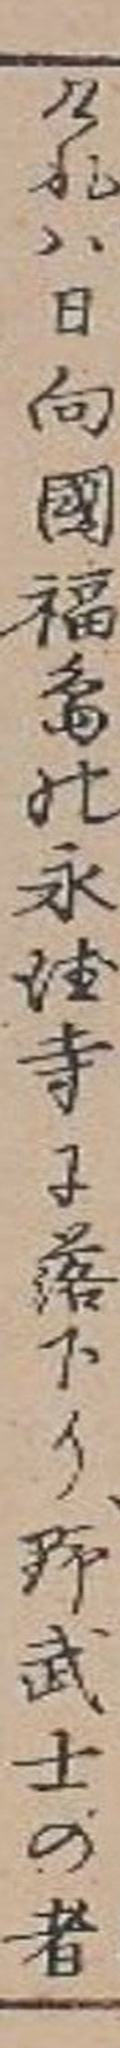ければ、日向国福島の永徳寺に落下り、野武士の者
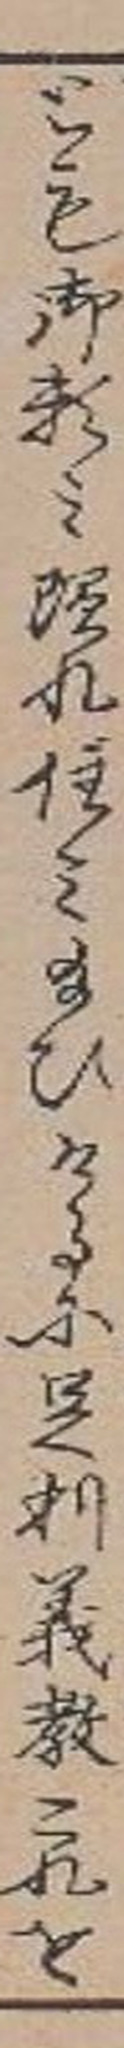ども御頼み隠れ住み給ひけるに、足利義教これを
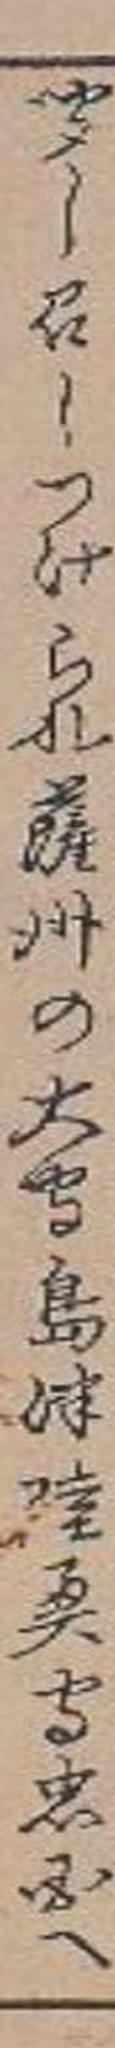聞し召しつけられ、薩州の大守島津陸奥守忠国へ

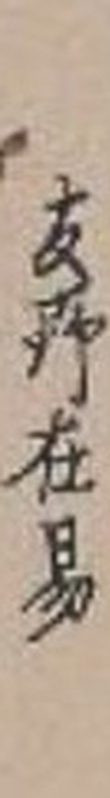友野在易
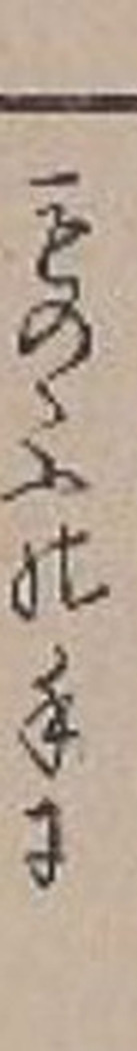ものゝふの手に
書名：琉球入貢紀略
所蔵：University of the Ryukyus Library
